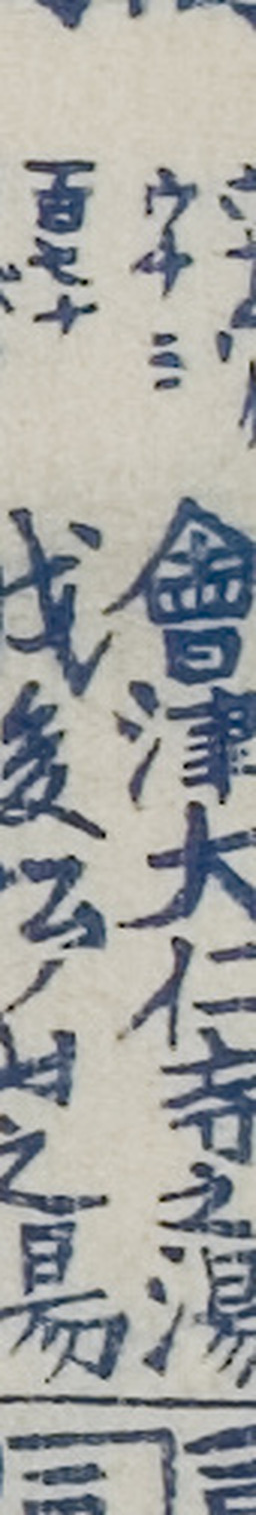同六十六リ会津天仁寺之湯
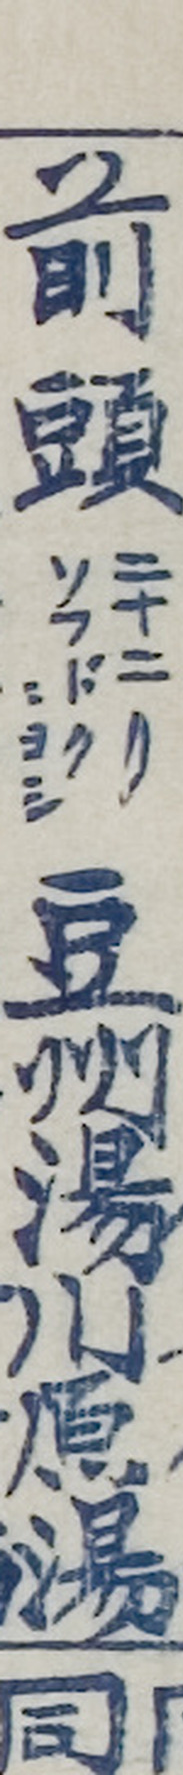前頭二十二リ豆州湯川原之湯
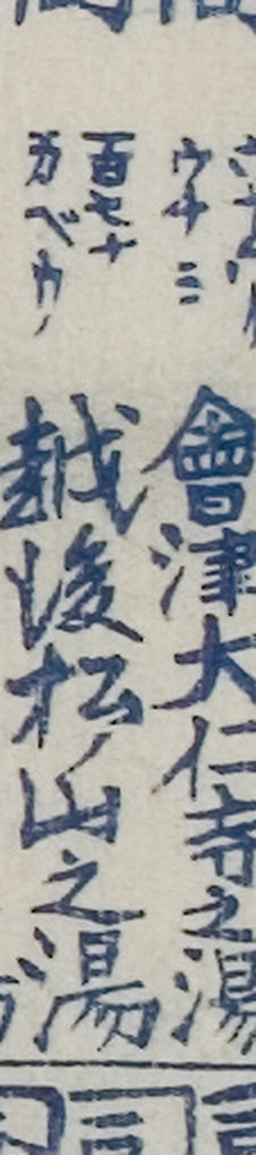同百七十リ越後松之山之湯
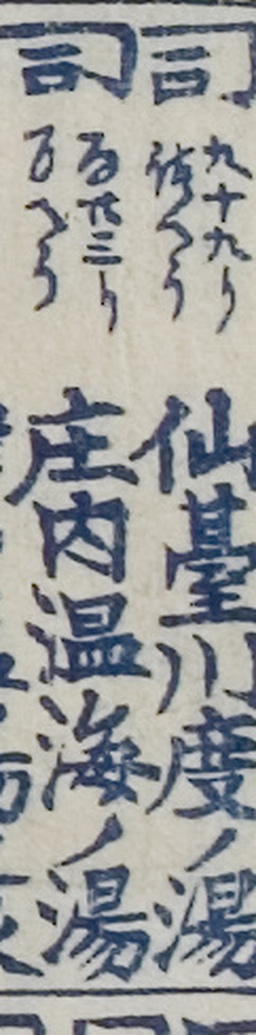同百二十三リ庄内温海之湯
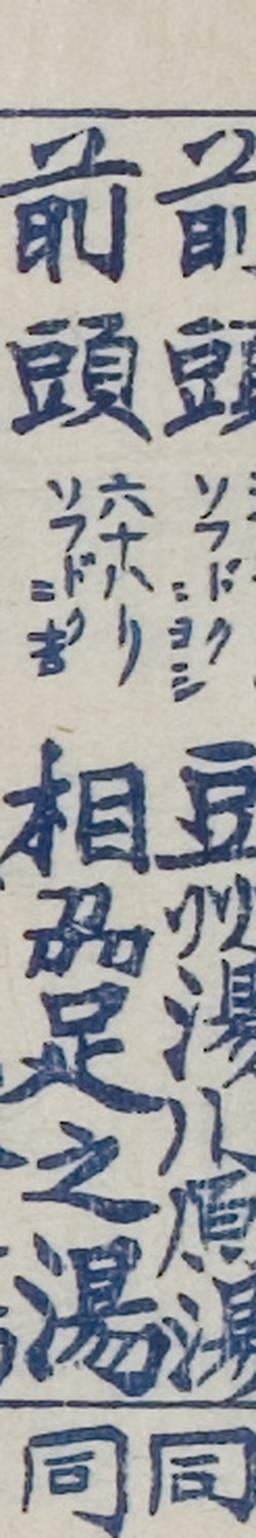前頭六十八リ相州足之湯
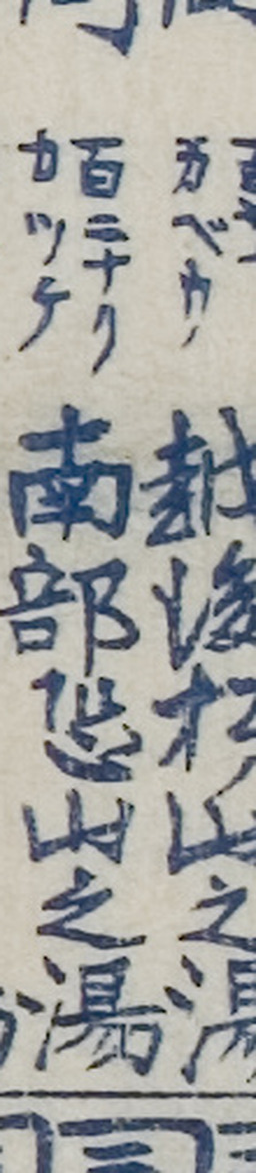同百二十リ南部恐山之湯
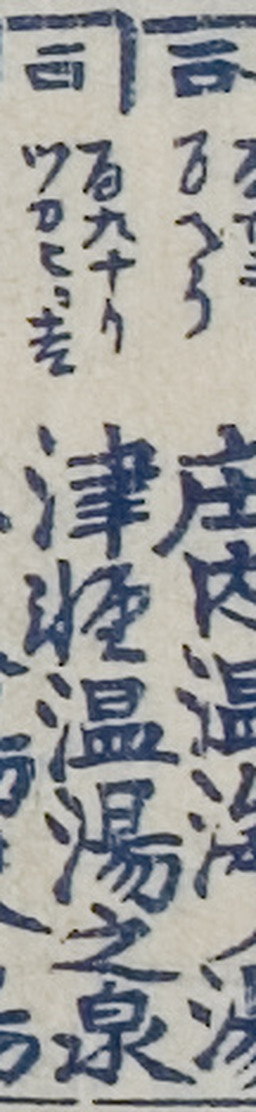同百九十リ津軽温湯之泉
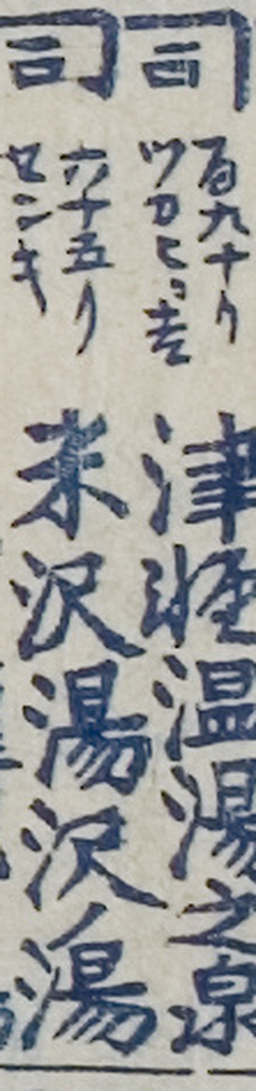同六十五リ米沢湯沢之湯
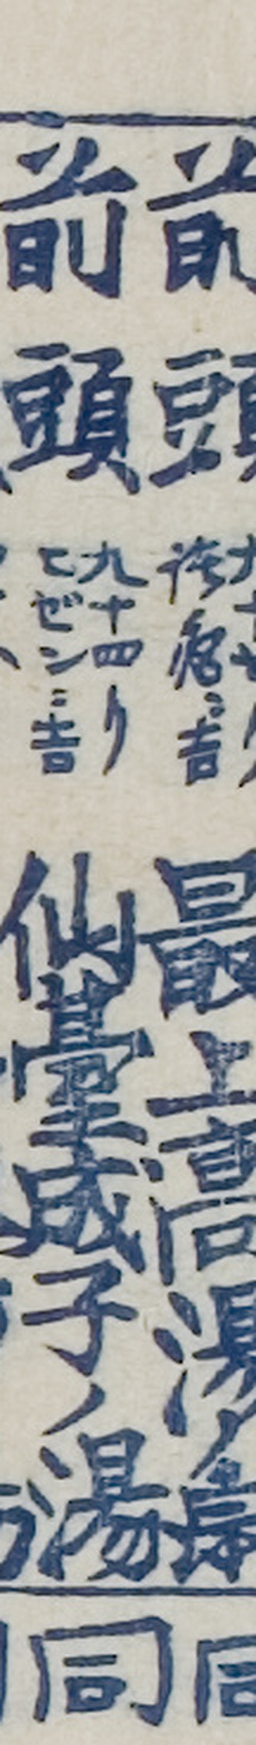前頭九十四リ仙台成子之湯
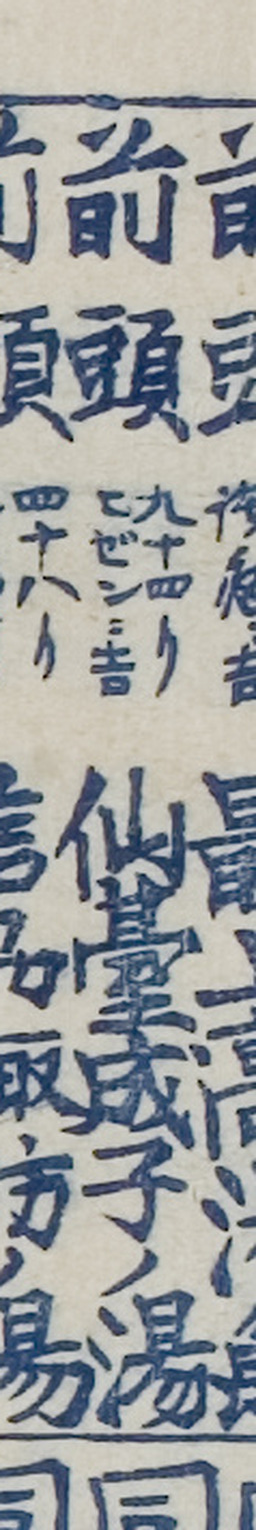前頭四十八リ信州諏訪之湯
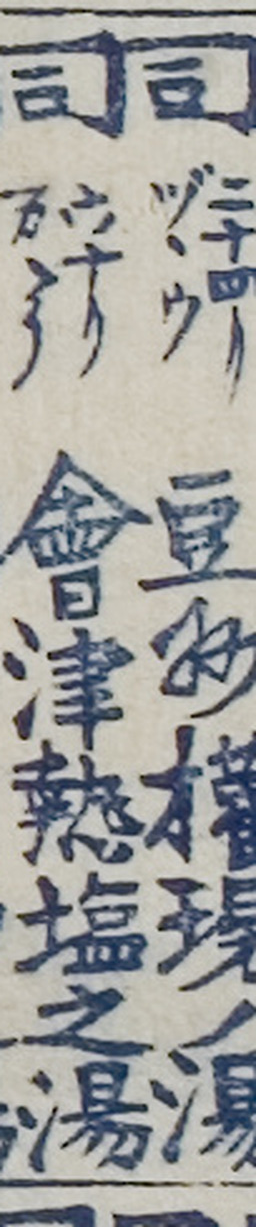同六十リ会津熱塩之湯
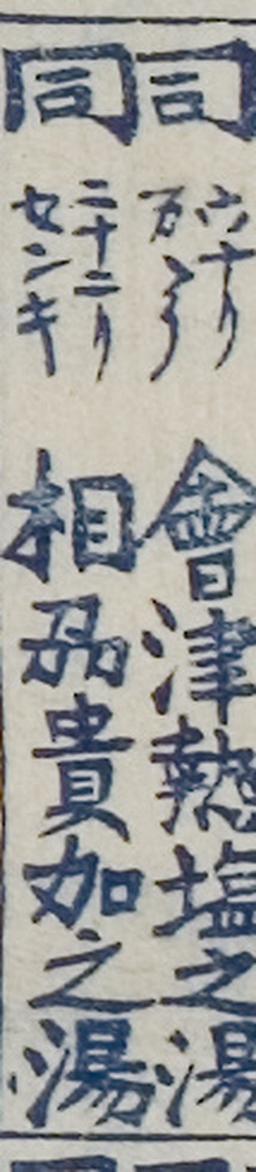同二十二リ相州貴知之湯
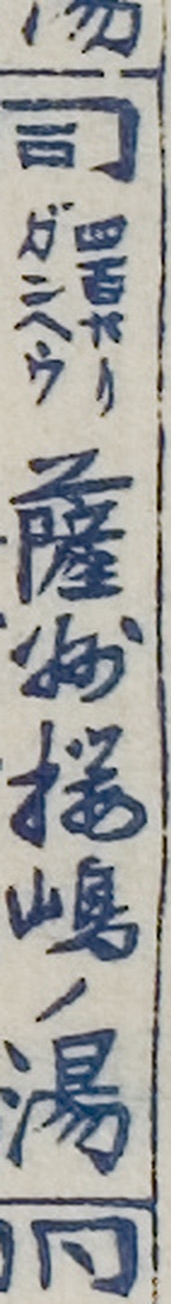同四百廿リ薩州桜嶋之湯
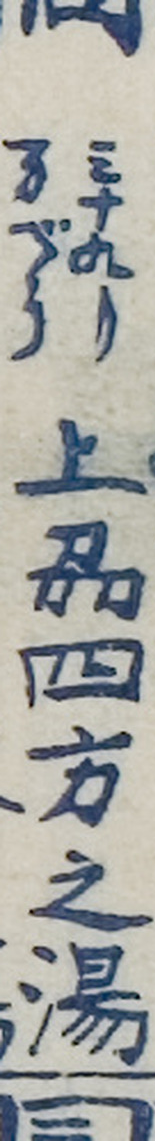同三十二リ野州塩原之湯
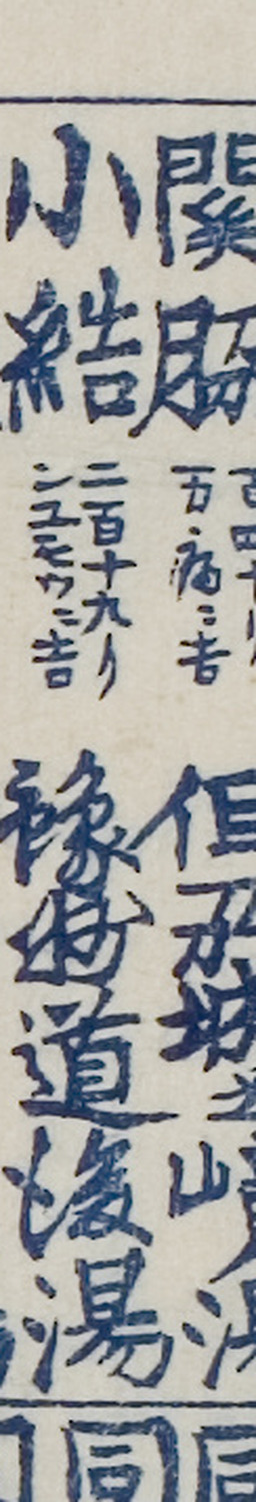小結二百十九リ予州道後之湯
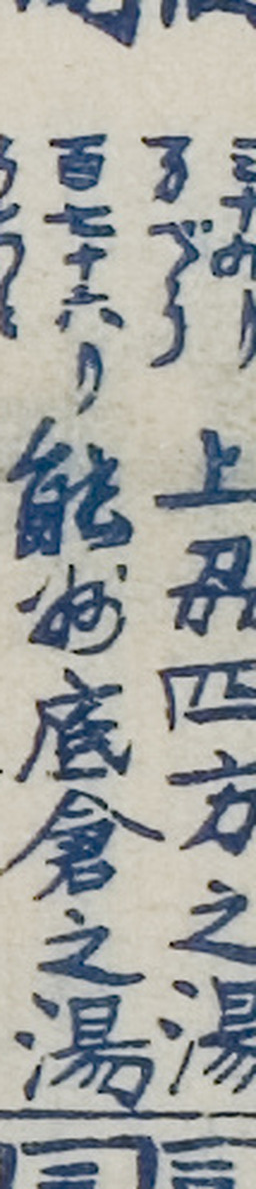同百七十六リ能州底倉之湯
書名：諸国温泉一覧
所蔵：東京大学総合図書館 General Library in the University of Tokyo, JAPAN
